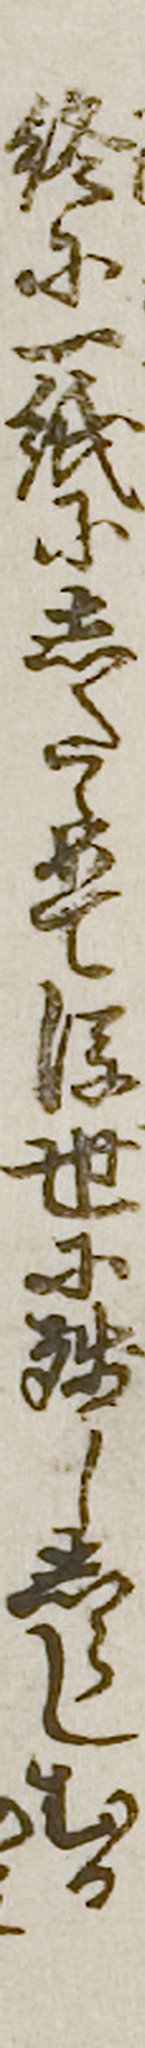終に一紙にしたゝめて後世に残ししらしむるのミ
